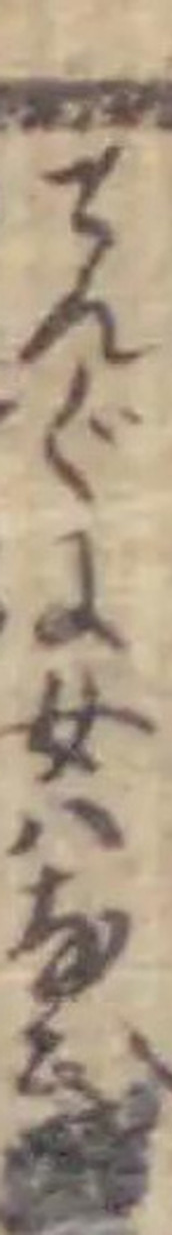てんぐに女はなき
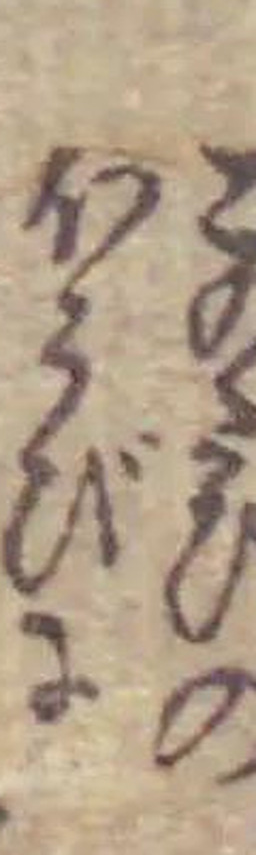ほうびに
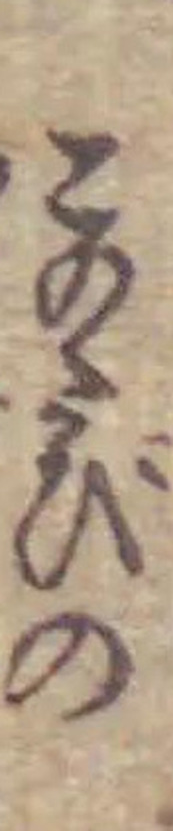このたびの
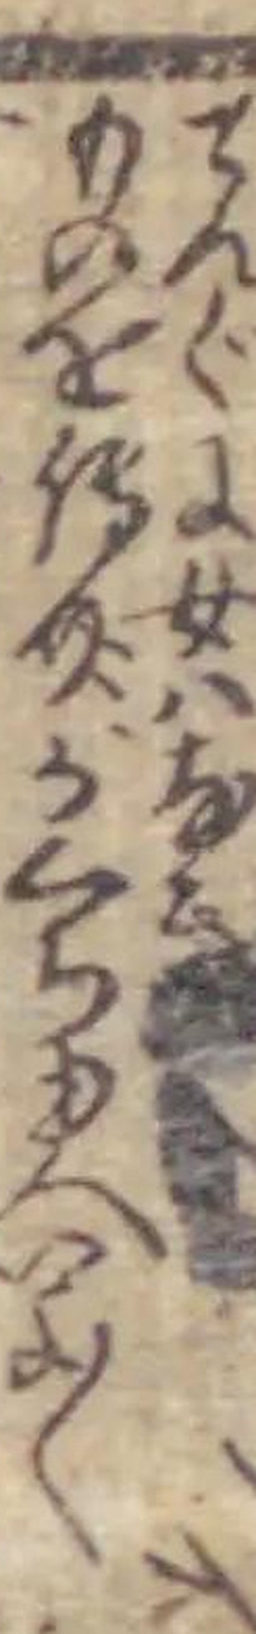ものを伝介がくちゆへいよ〳〵
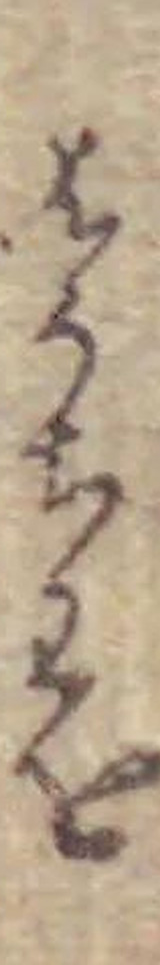はうちわを
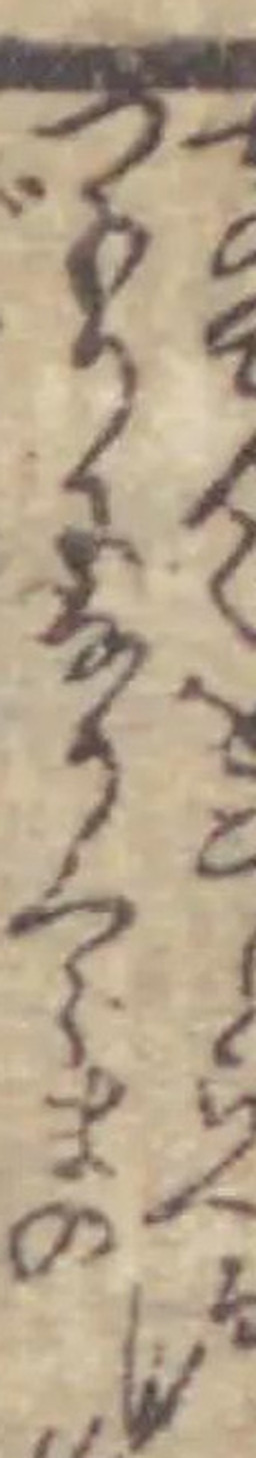つもりになりくらまの
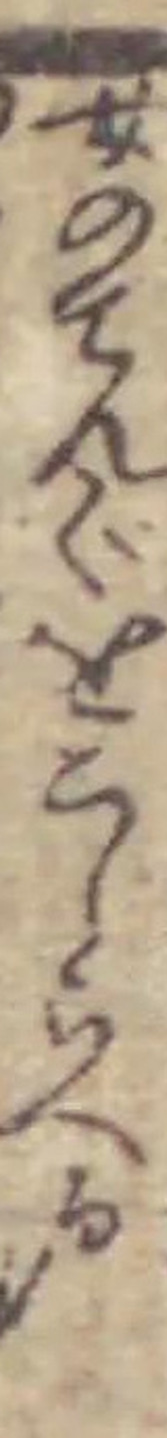女のてんぐをこしらへる
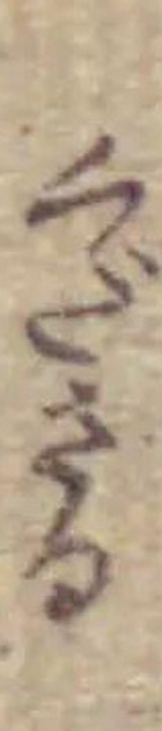くださる
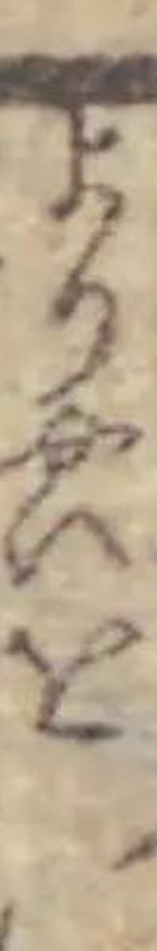よりやいを
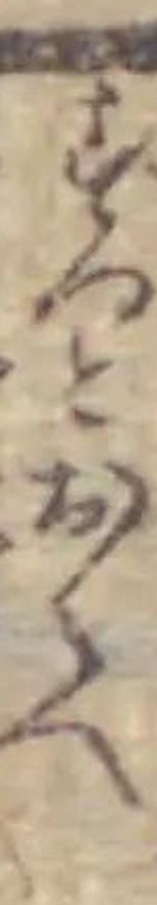ずつとおくへ
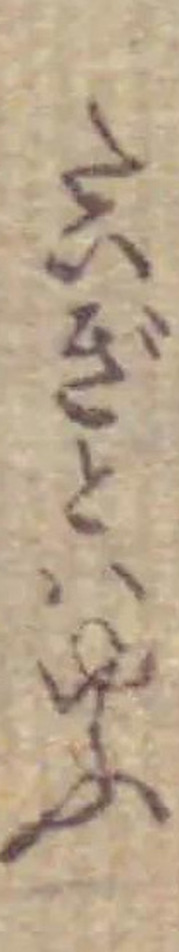たいぎとハゆふ
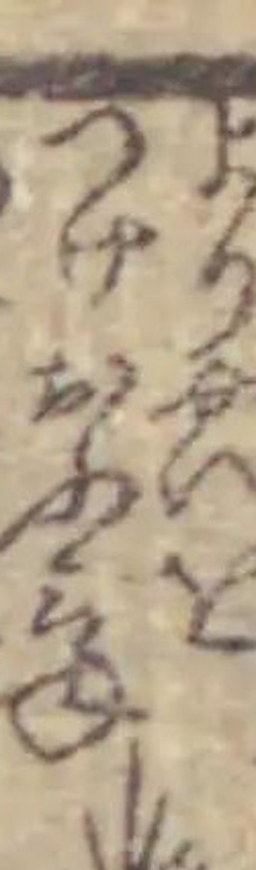つけおふみね
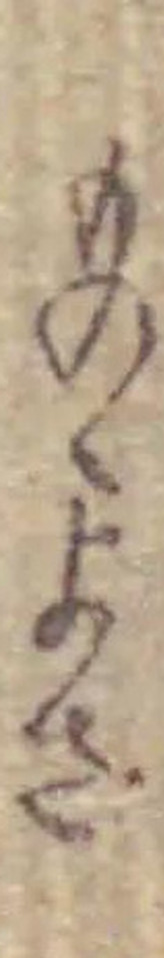ものゝよさ
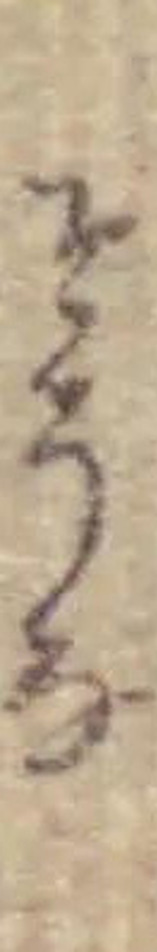そうな
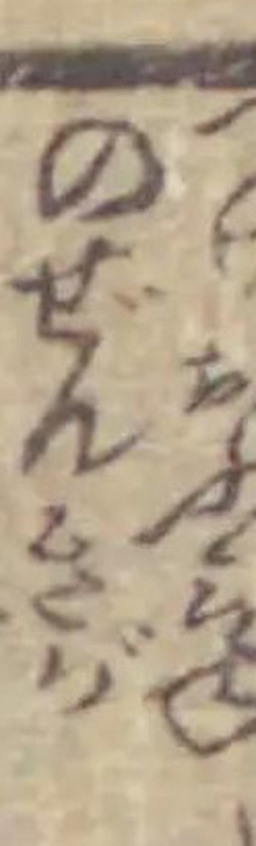のぜんきが
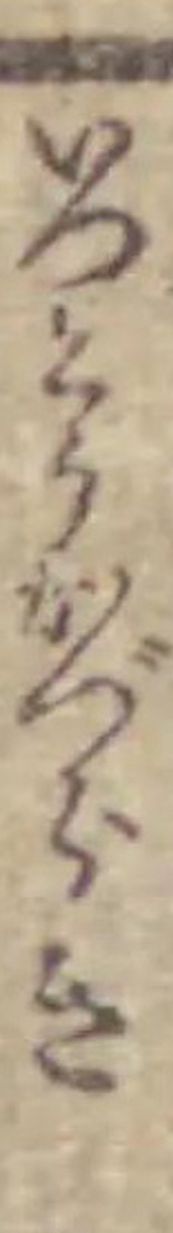いつとうかづらき
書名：珍説女天狗 2巻
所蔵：国立国会図書館 National Diet Library, JAPAN
